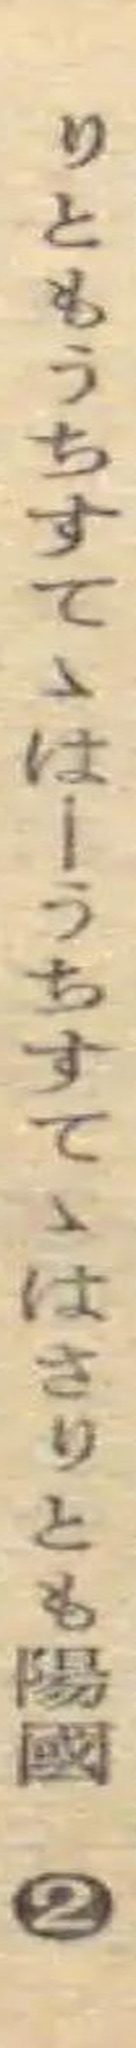りともうちすてゝは―うちすてゝはさりとも陽国➋
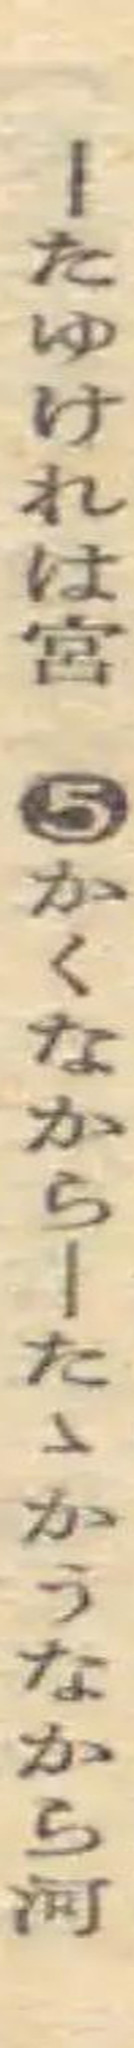―たゆけれは宮❺かくなから―たゝかうなから河
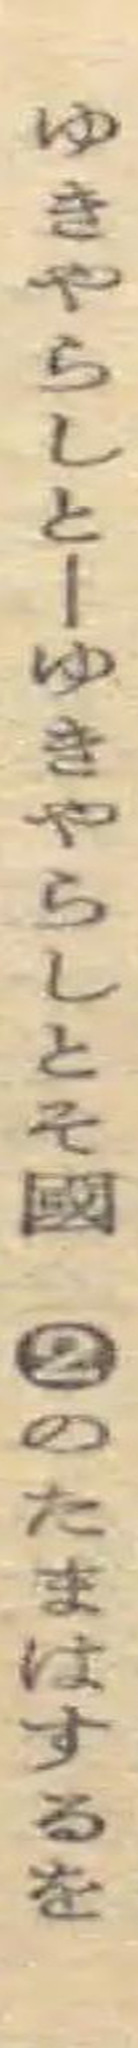ゆきやらしと―ゆきやらしとそ国➋のたまはするを
